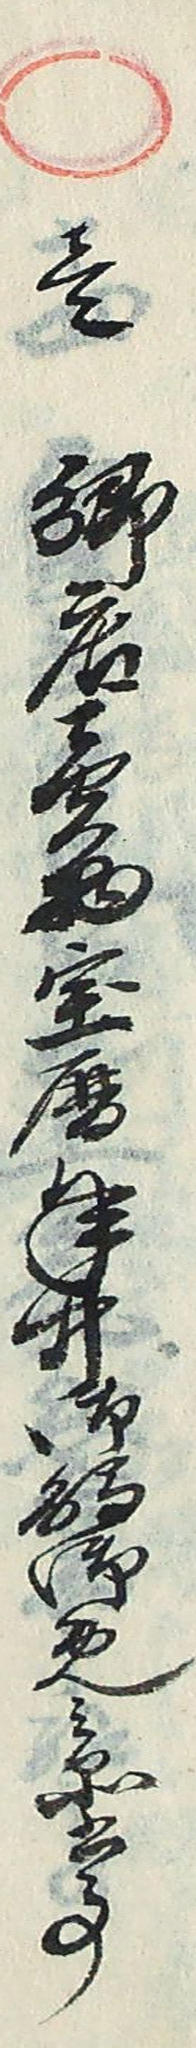朱丸壱郷店賣物宝暦年中御觸御免之品書事
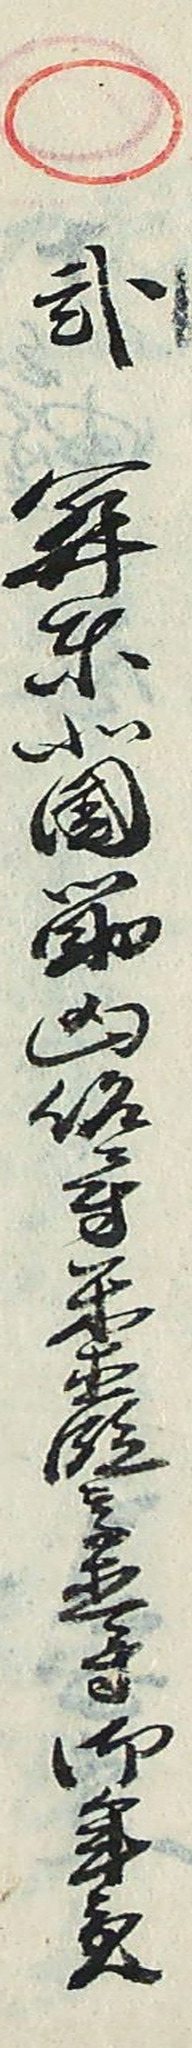朱丸弐関東北國筋凶作ニ付米直段高直ニ付御年貢
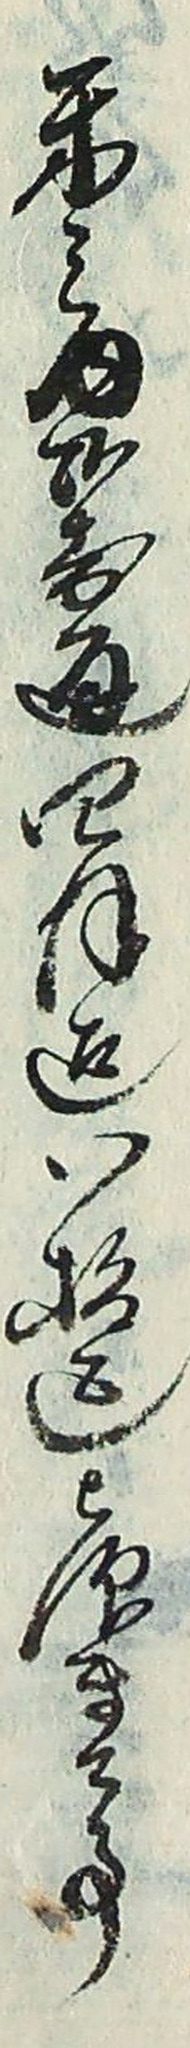米之内弐歩通四月迄御指延被仰付候事
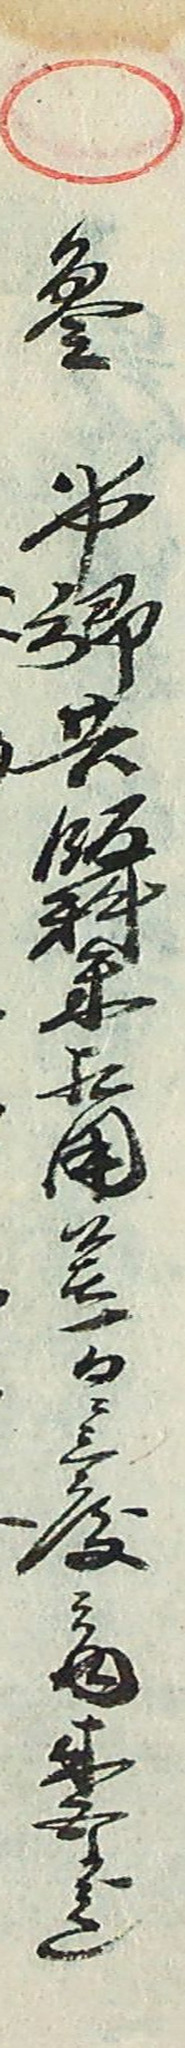朱丸参市郷共飯料米相用節一日ニ三度之内来五月迄
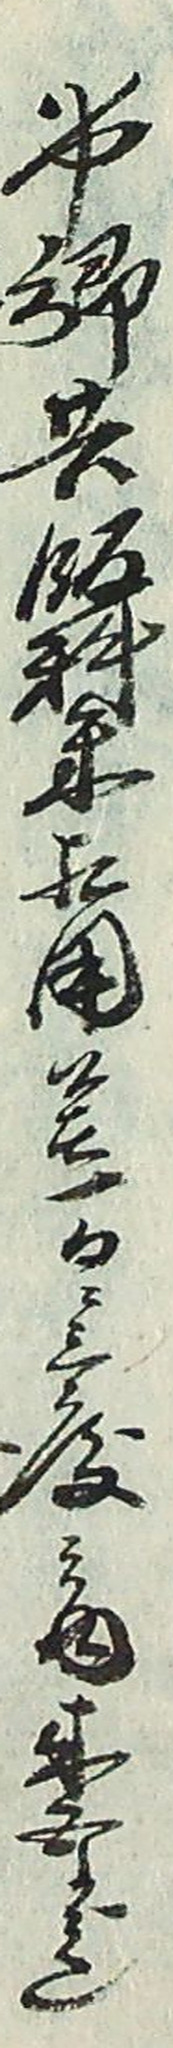朱丸参市郷共飯料米相用節一日ニ三度之内来五月迄
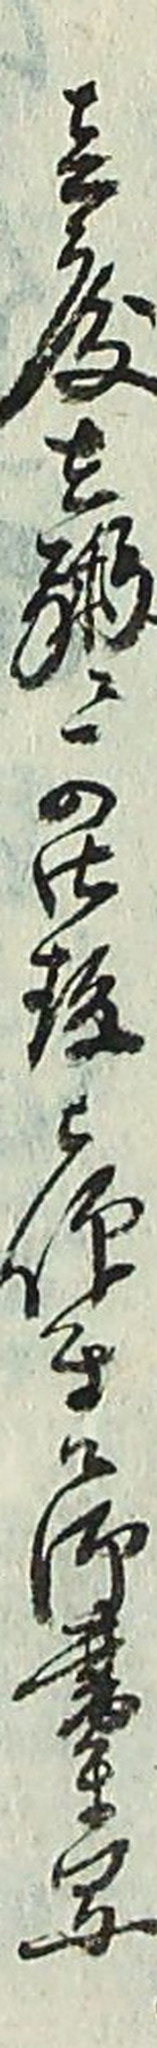壱度を粥ニ可仕趣被仰付候御書付写
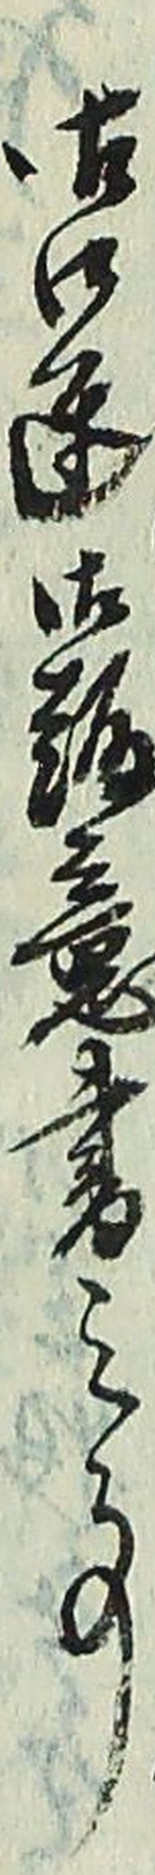御口達御趣意書之事
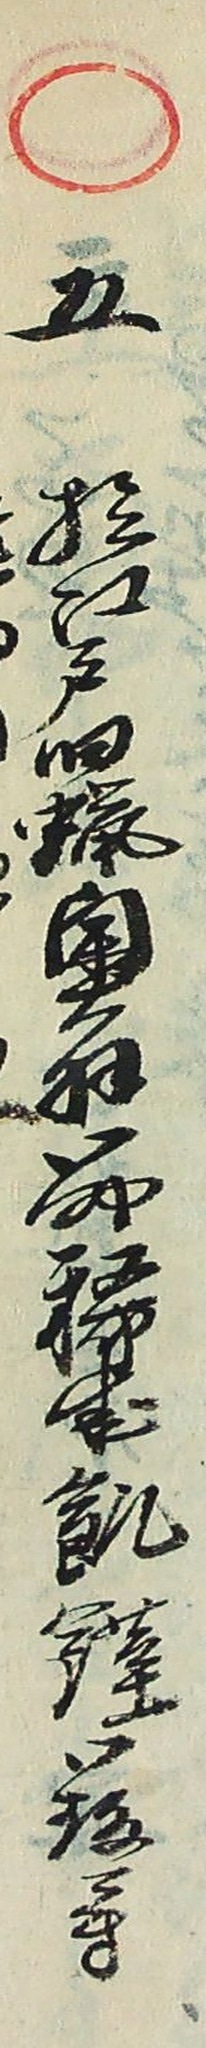朱丸五於江戸旧蝋奥羽筋稀成飢饉御趣ニ付
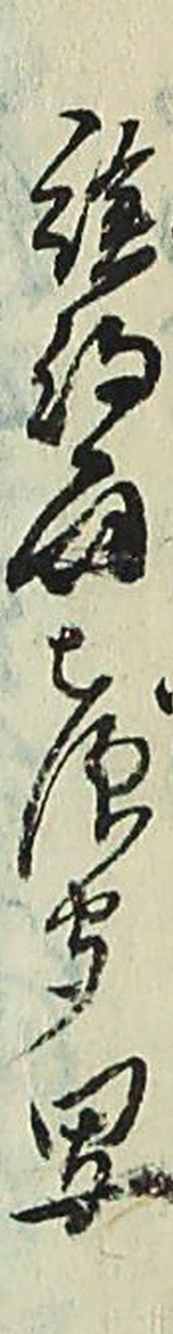倹約向被仰聞写
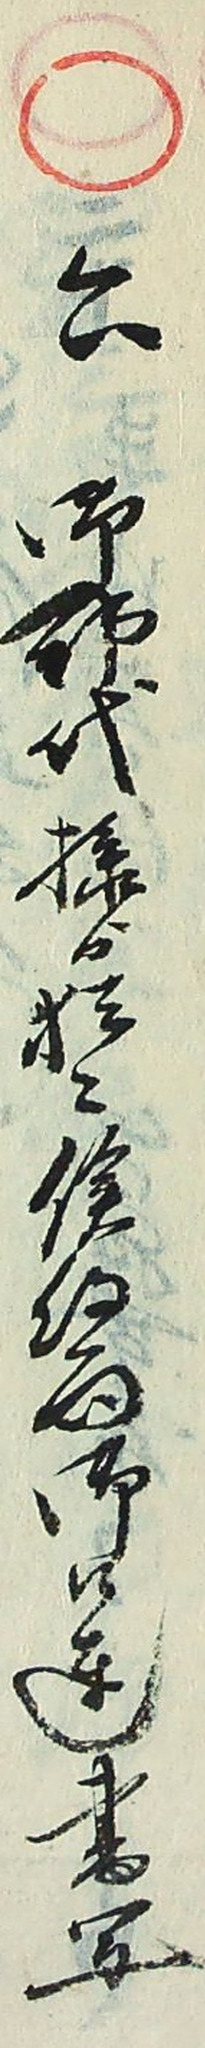朱丸六御郡代様ゟ猶々倹約向御口達書写
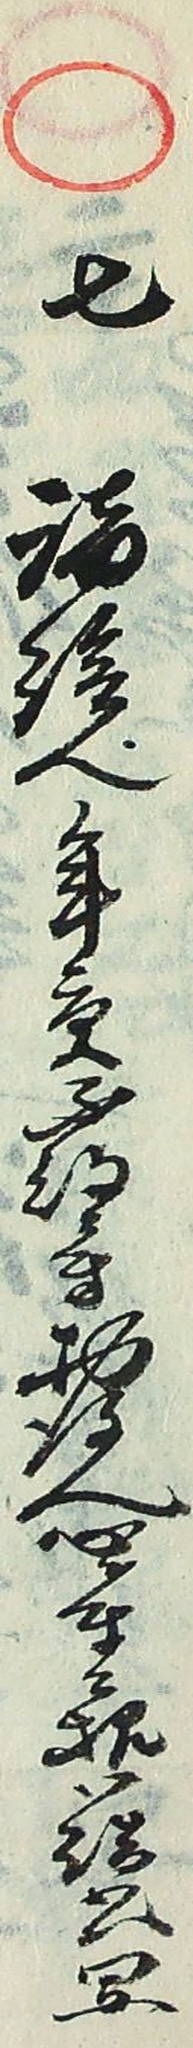朱丸七諸給人年貢不都ニ付村役人心ヲ付候様御端書写
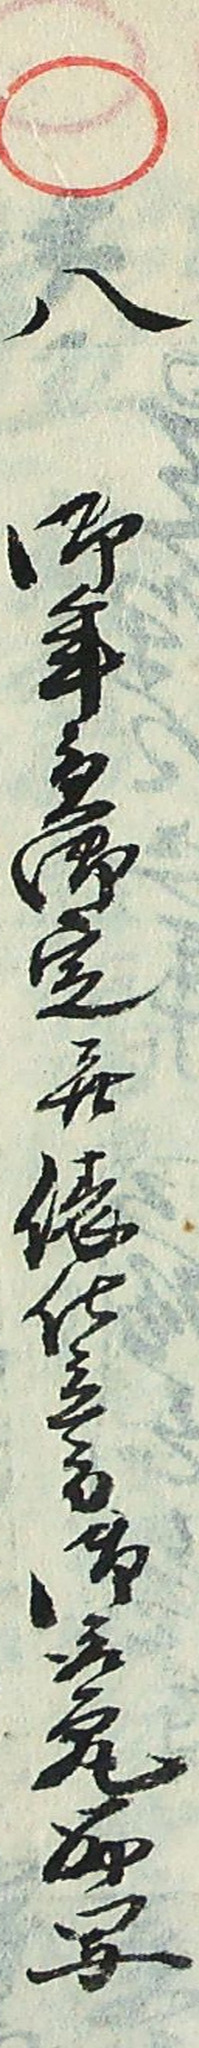朱丸八御年貢御定幷俵仕立方御取究筋写
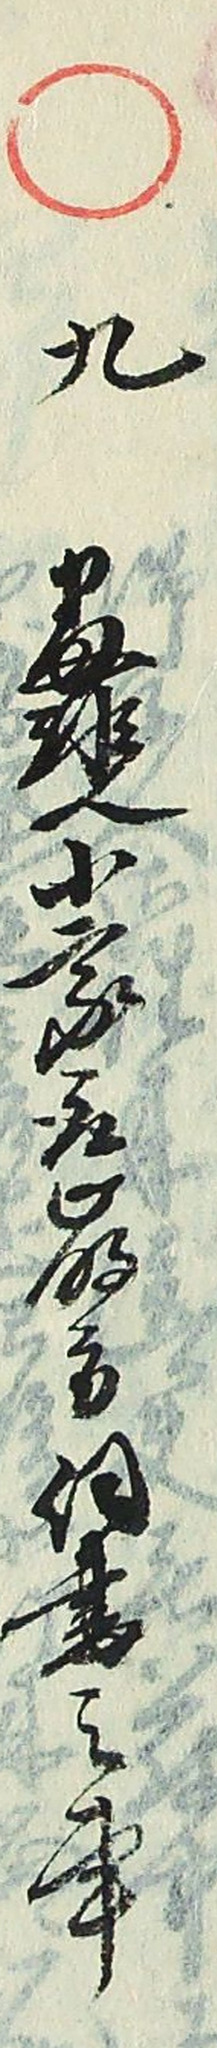朱丸九番非人小家取崩方伺書之事
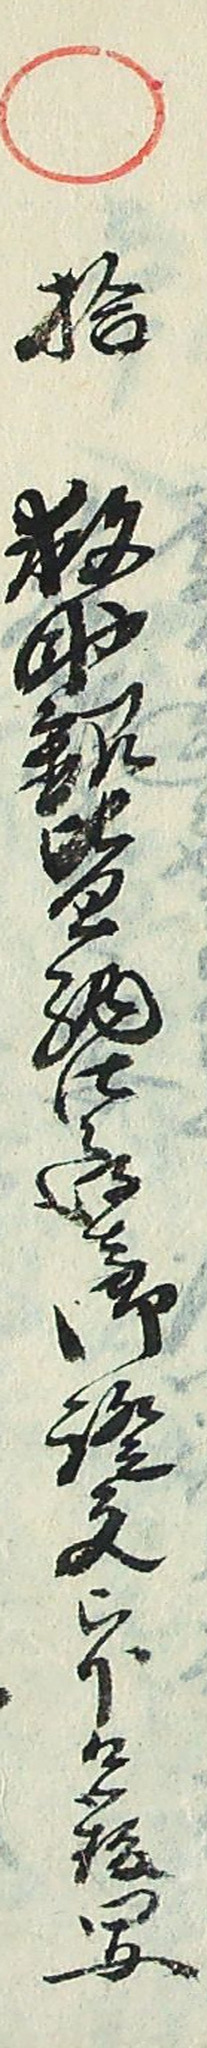朱丸拾救助銀皆納仕候得者御證文被下候御趣写
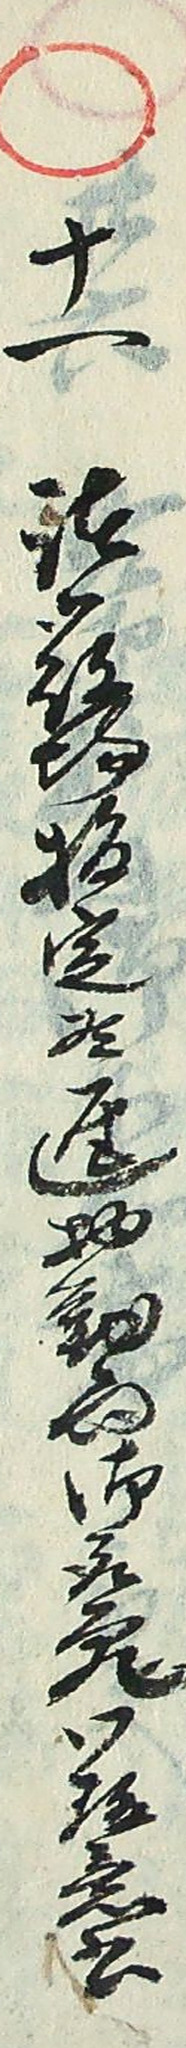朱丸十一諸御役場指定候進物勤向御取究御趣意書

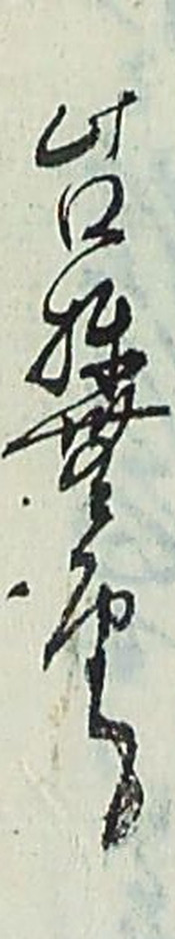卯此御株無御座候
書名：諸御趣意書并御下知向之写
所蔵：鳴門教育大学 Naruto University of Education
